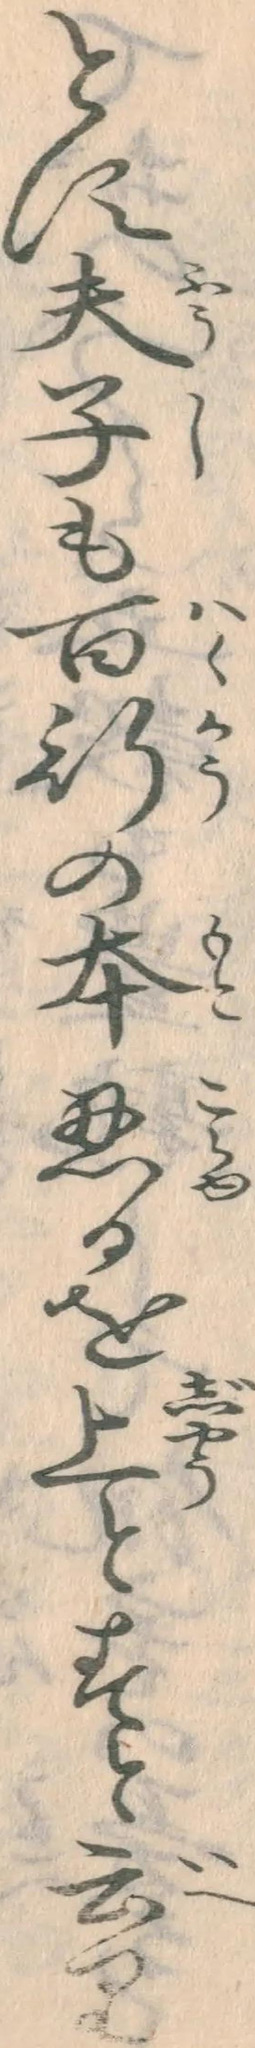とす夫子も百行の本忍るを上とすと言り
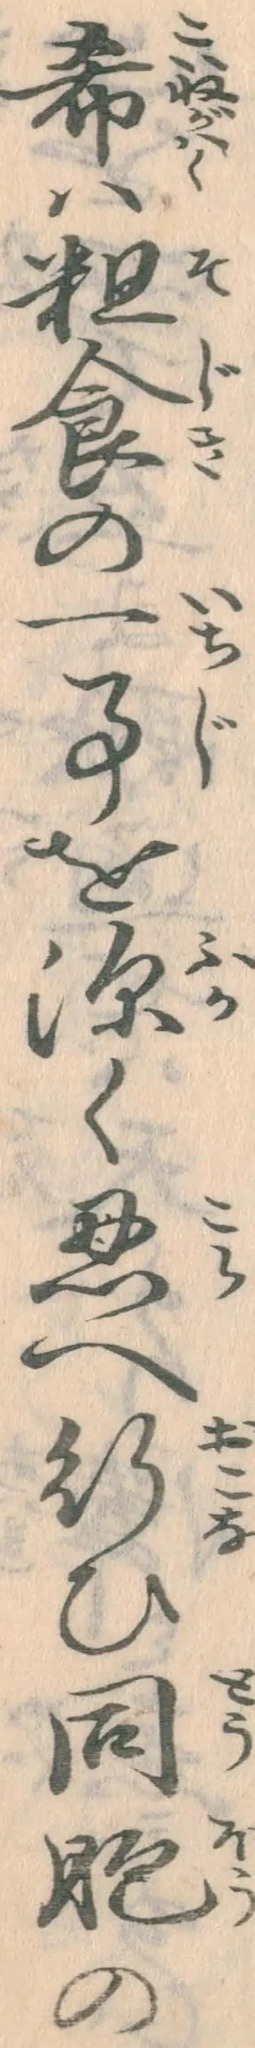希は粗食の一事を深く忍へ行ひ同胞の

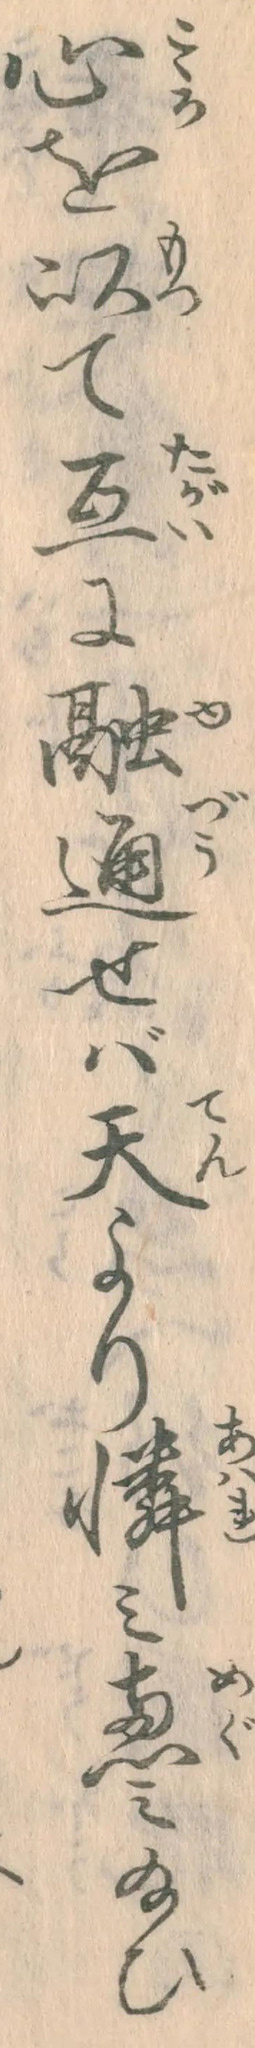心を以て互に融通せば天より憐み恵み給ひ
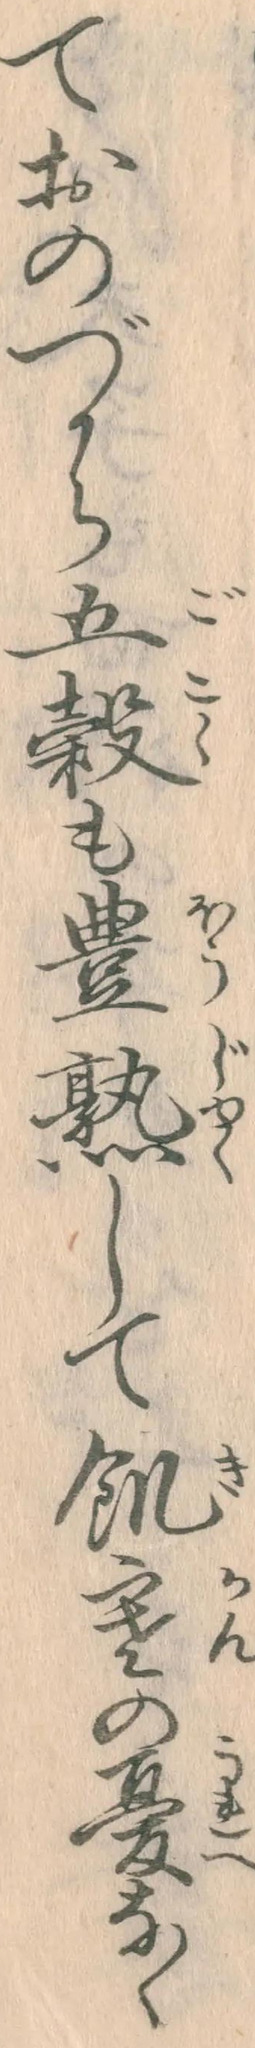ておのづから五穀も豊熟して飢寒の憂なく
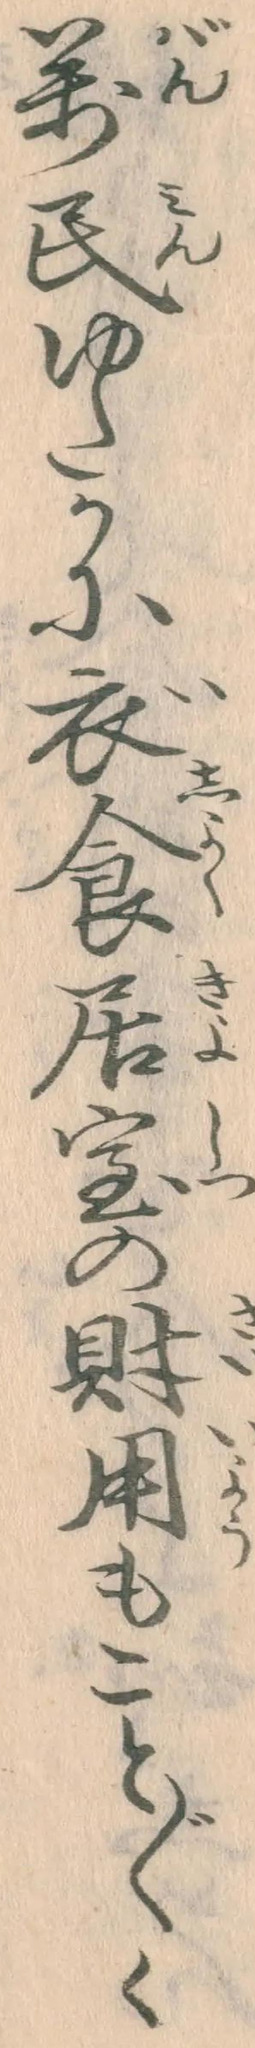万民ゆたかに衣食居室の財用もこと〴〵く
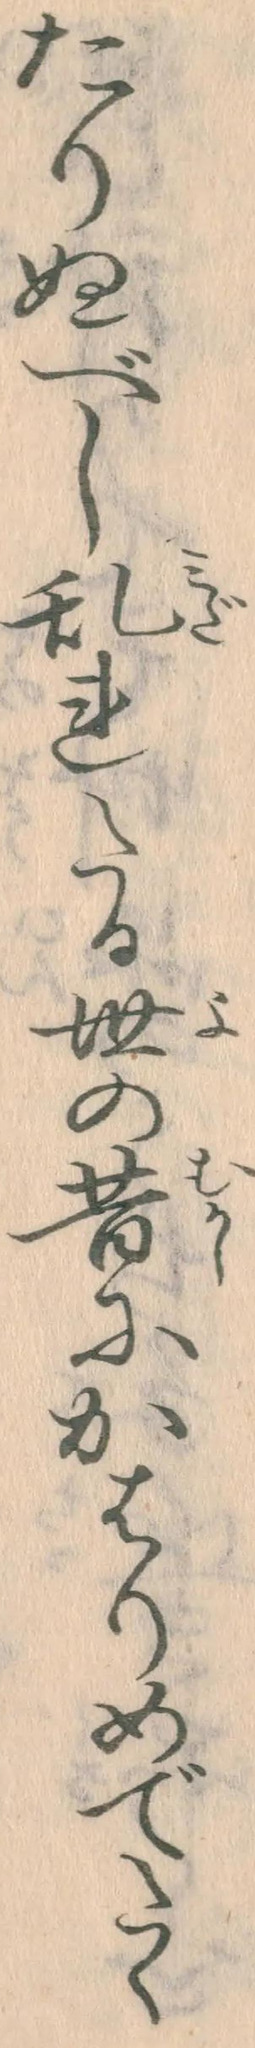たりぬべし乱れたる世の昔にかはりめでたく
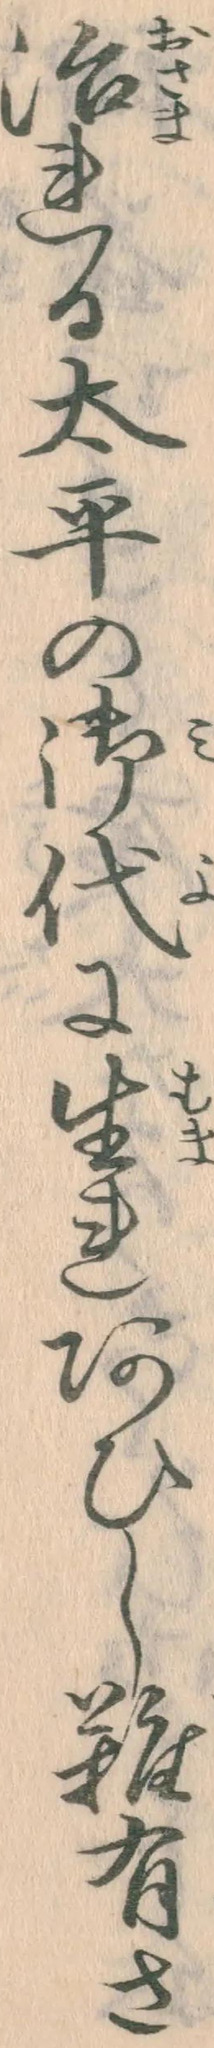治れる太平の御代に生れあひし難有さ
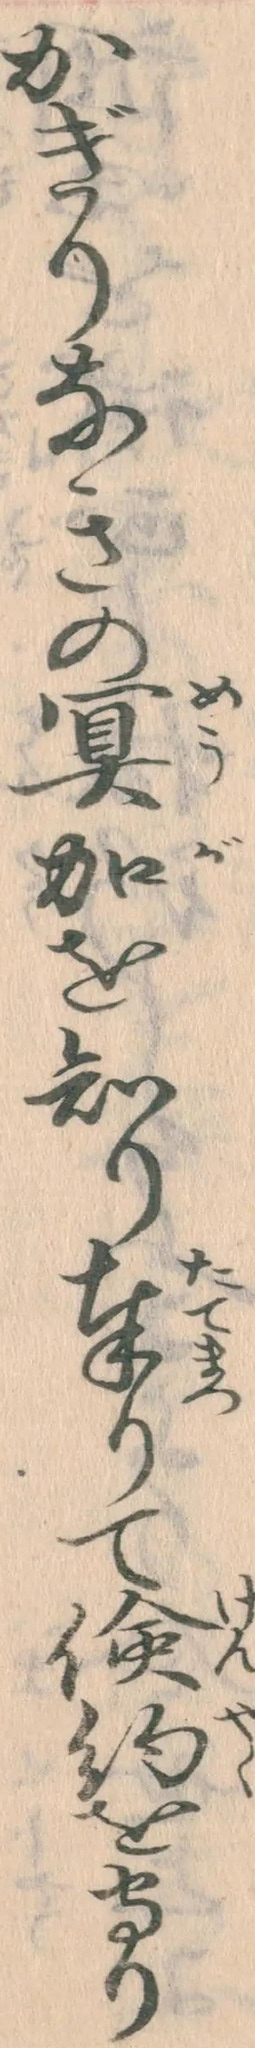かぎりなきの冥加を知り奉りて倹約を守り
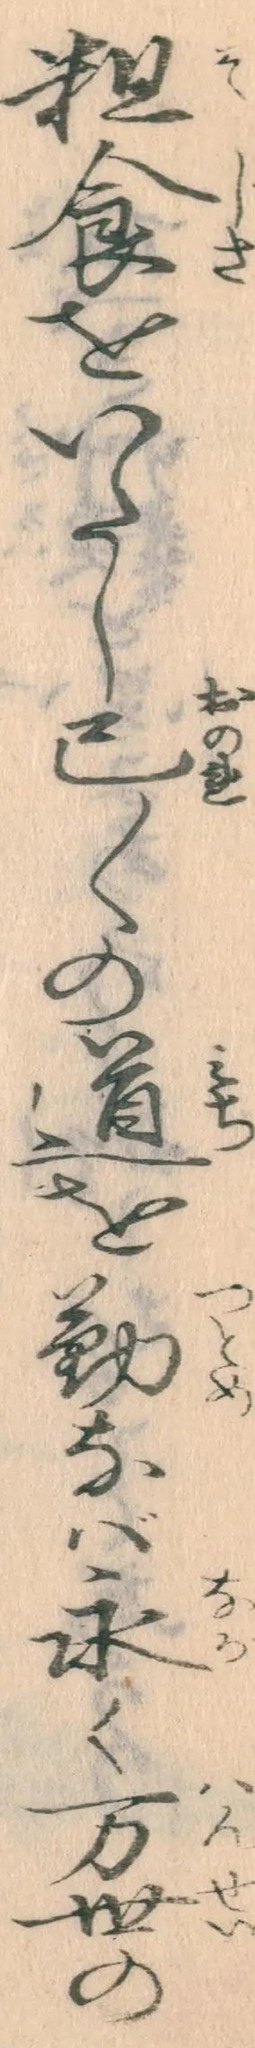粗食をいたし己〳〵の道を勤なば永く万世の
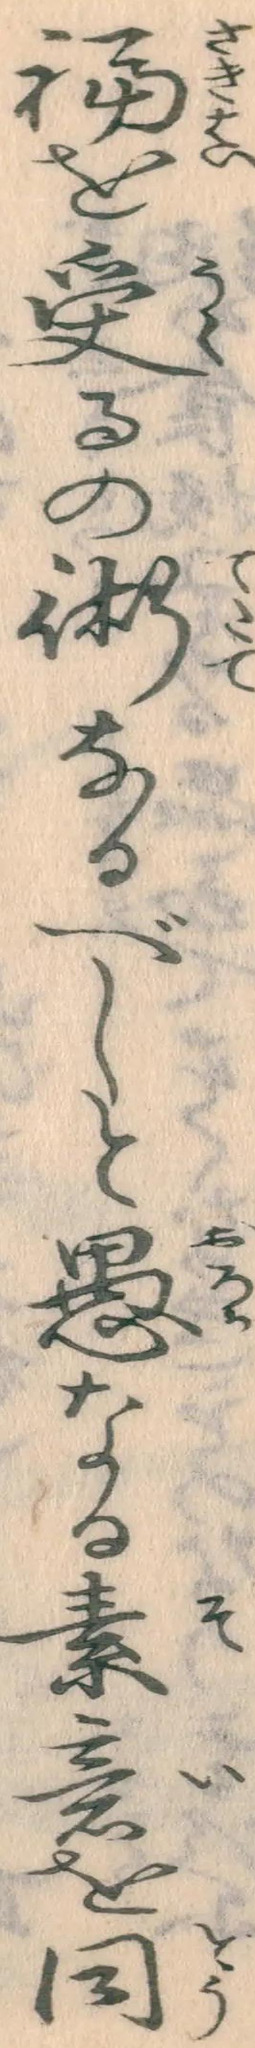福を受るの術なるべしと愚なる素意を同
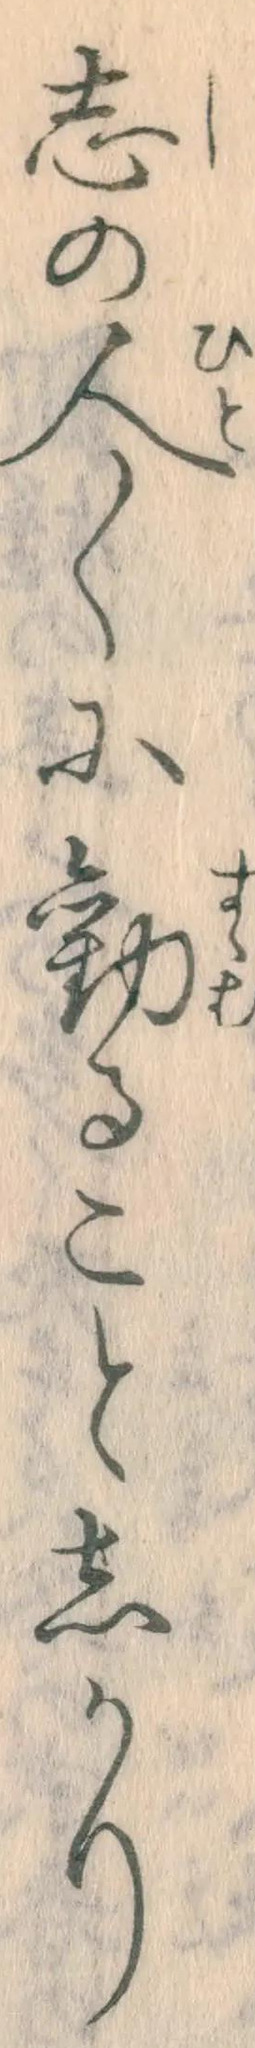志の人〳〵に勧ることしかり
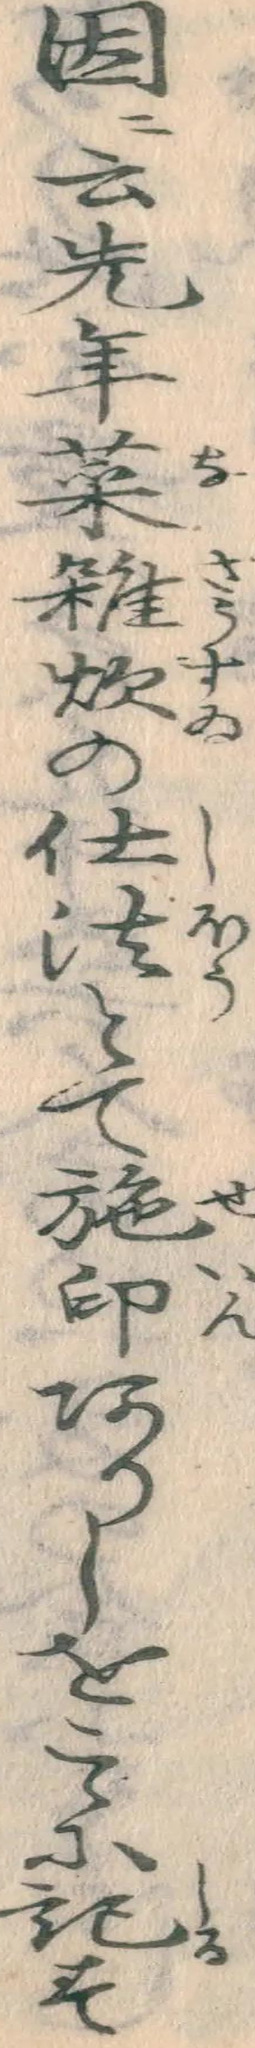因に云先年菜雑炊の仕法とて施印ありしをこゝに記す
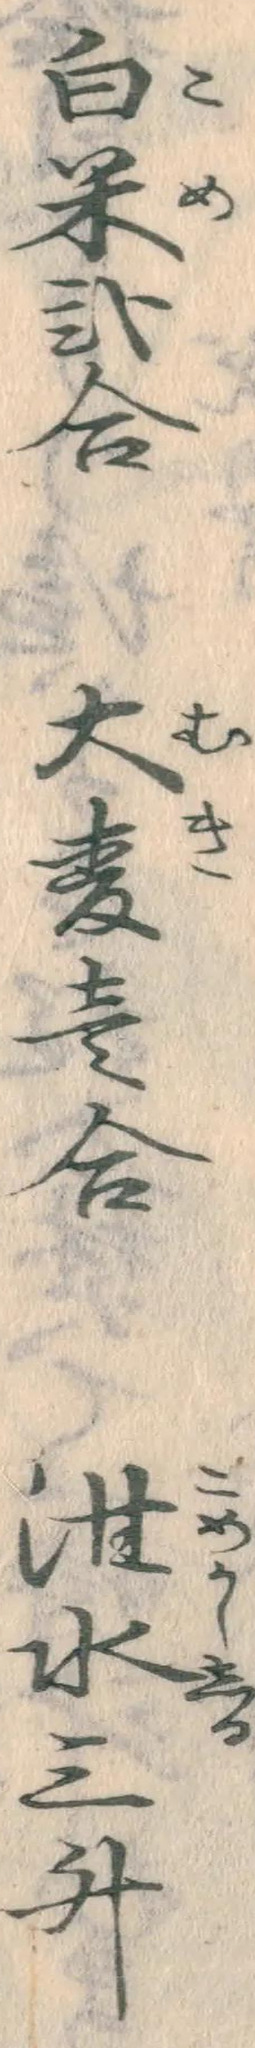白米弐合大麦壱合泔水三升
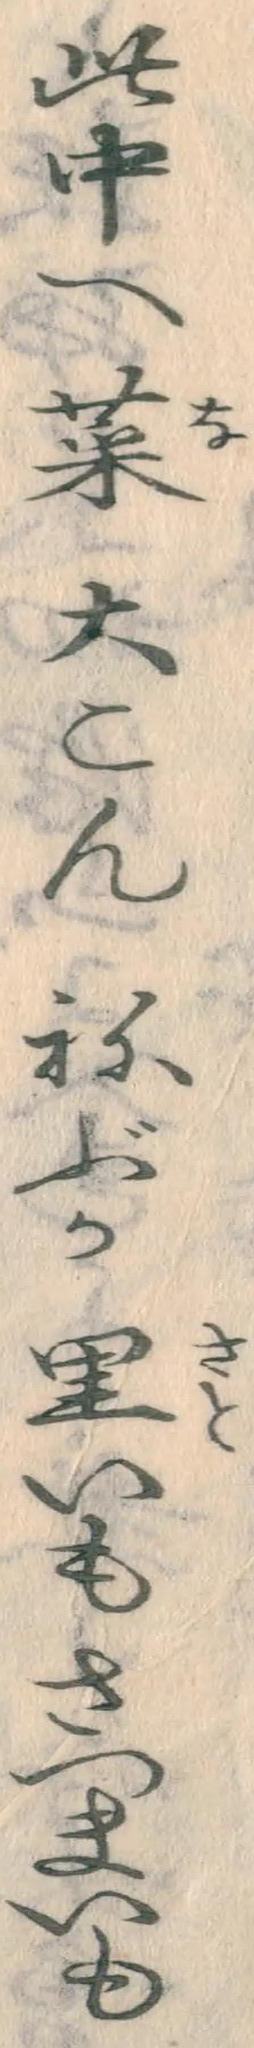此中へ菜大こんねぶか里いもさつまいも
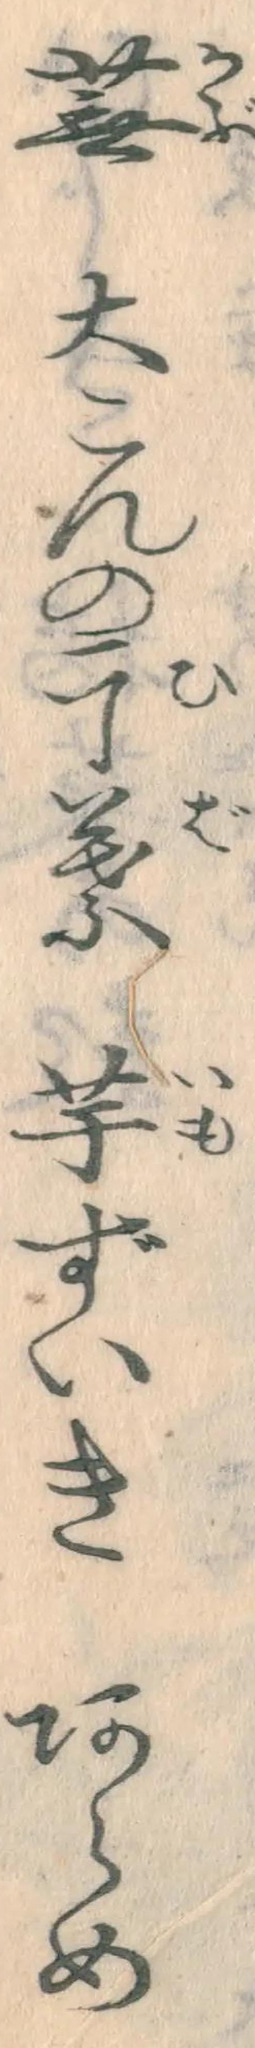蕪大こんの干葉芋ずいきあらめ

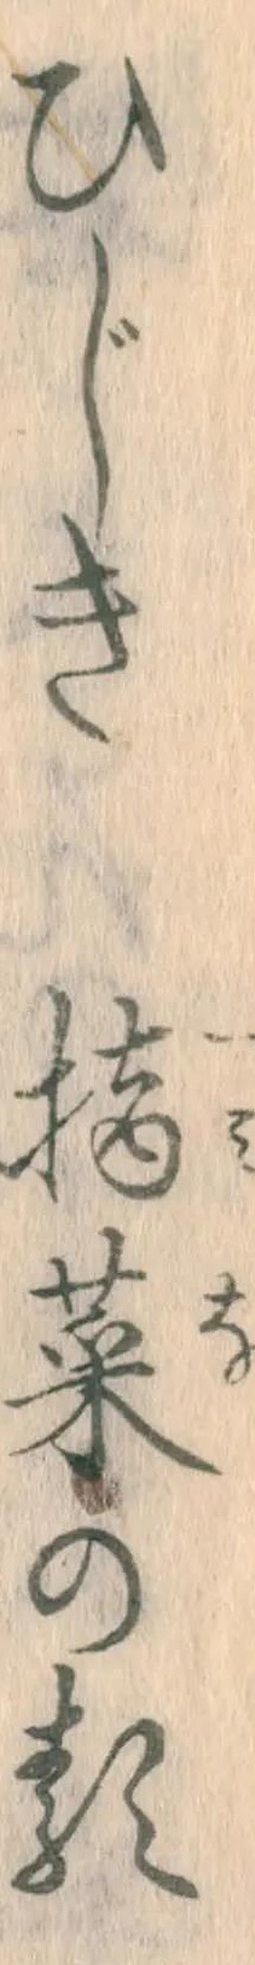ひじき摘菜の類
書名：救荒野菜圖説
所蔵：国立国会図書館 National Diet Library, JAPAN
